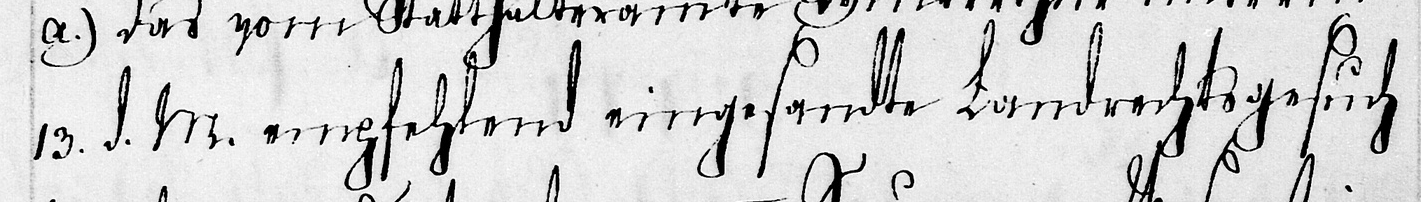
13. d. M. empfehlend eingesandte Landrechtsgesuch
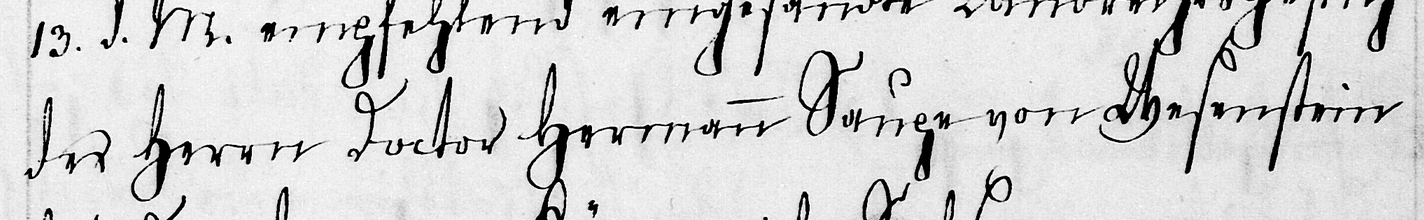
des Herrn Doctor Hermann Saupe von Wesenstein
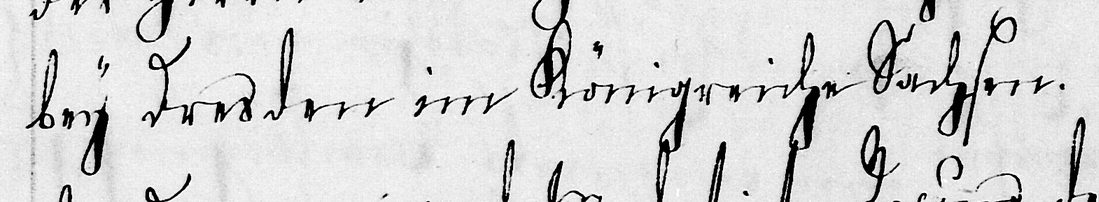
bey Dresden im Königreiche Sachsen.
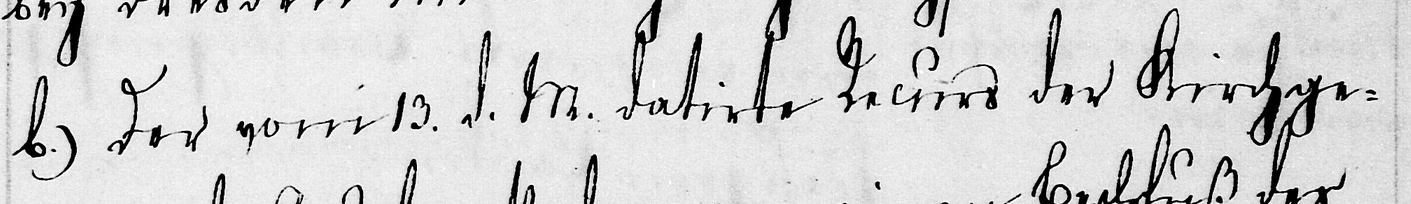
b.) Der vom 13. d. M. datirte Recurs der Kirchge¬
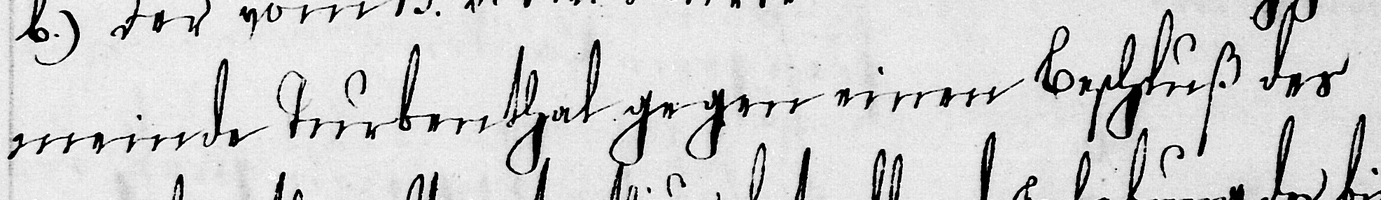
meinde Turbenthal gegen einen Beschluß des
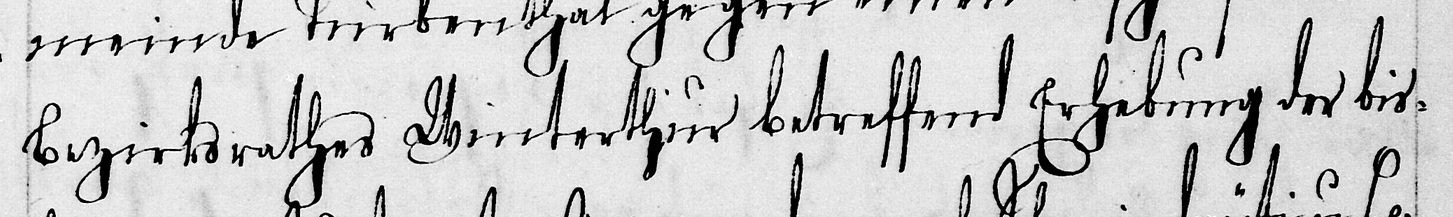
Bezirksrathes Winterthur betreffend Erhebung der bis¬
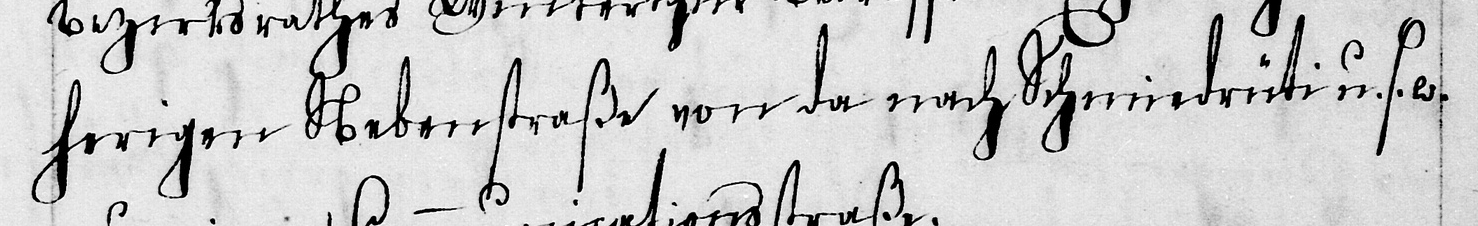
herigen Nebenstraße von da nach Schmiedrüti u. s.
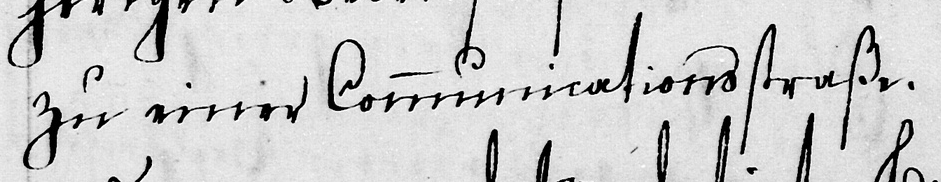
zu einer Communicationsstraße.
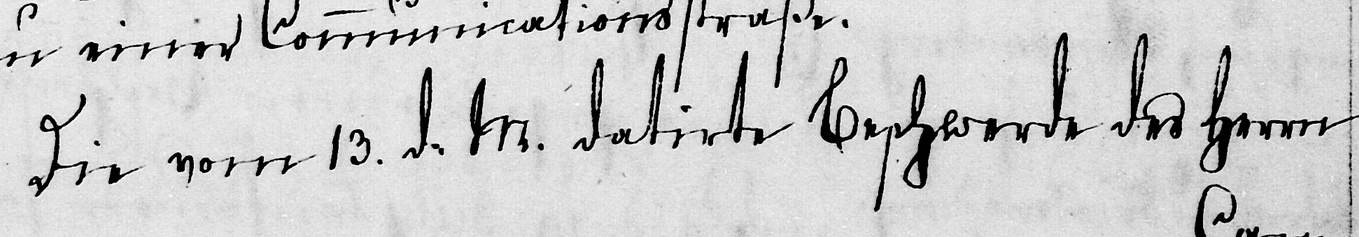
Die vom 13. d. M. datirte Beschwerde des Herrn
